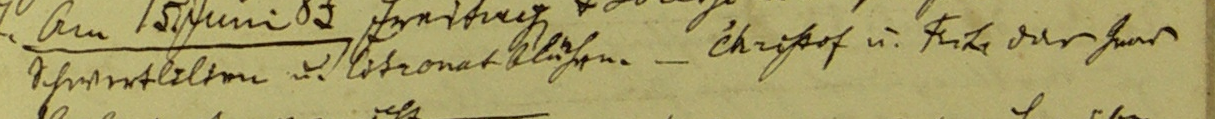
Schwertlilien und Citronat blühen.- Christof und Teita das Gras
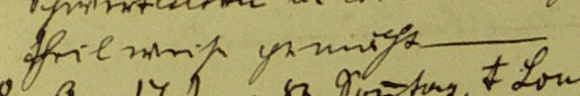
theilweise gemäht.-
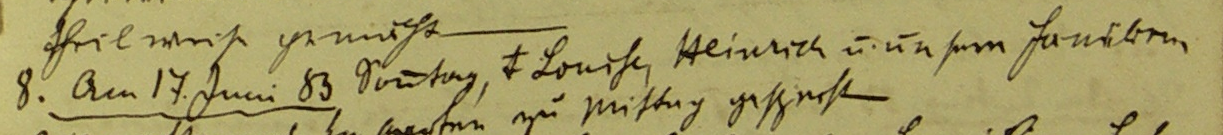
8) Am 17 Juni 83 . Sonntag, mit Louise, Heinrich und unseren Familien
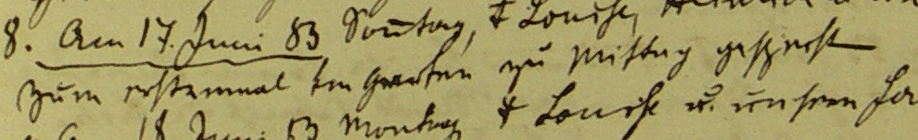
zum erstenmal im Garten zu Mittag gespeist.
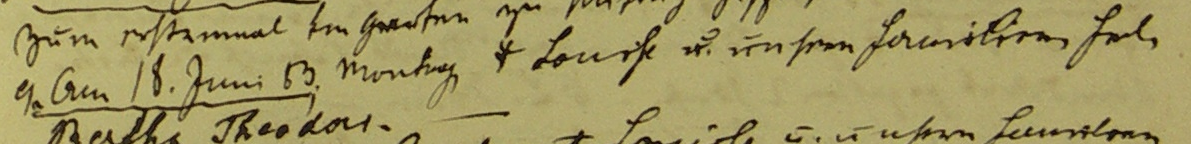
9) Am 18. Juni 83. Montag mit Louise und unseren Famil, Frl.
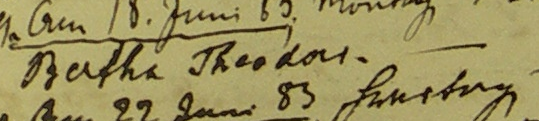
Bertha Theodore.
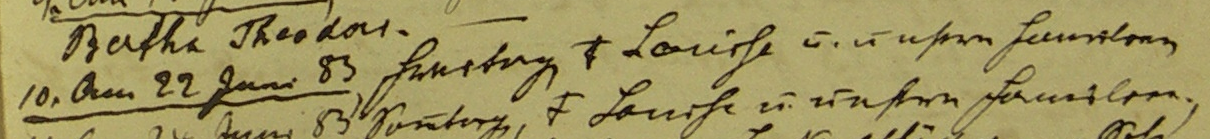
10) Am 22 Juni 83. Freitag mit Louise und unseren Familien.
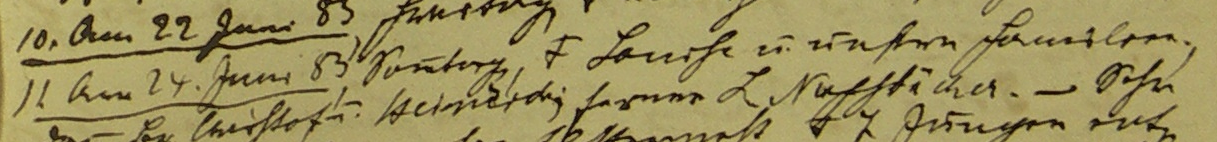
11) Am 24 Juni 83 Sonntag, mit Louise und unseren Familien,
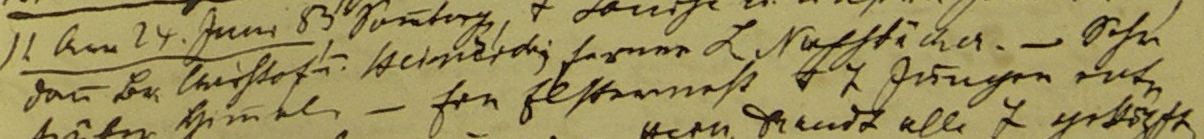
dann Br. Christof und Heinrich, ferner L. Nussbächer.- Sehr
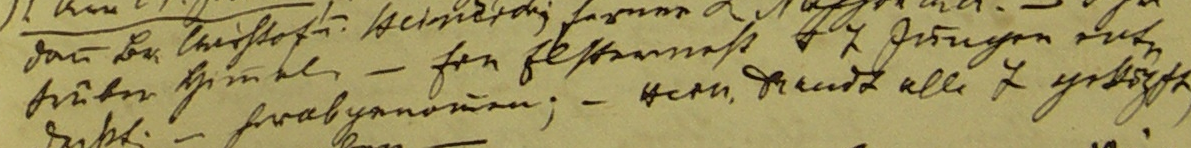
trüber Himmel- Ein Elsternest mit 7 Jungen ent¬
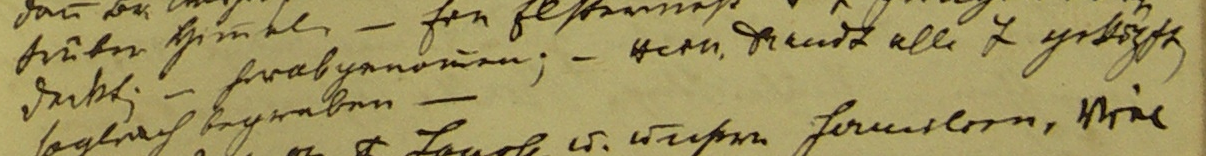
deckt.- herabgenommen;- Hein. Draudt alle 7 geköpft,
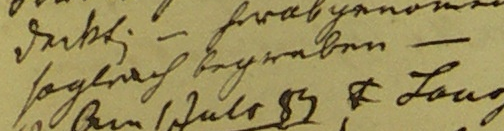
sogleich begraben.
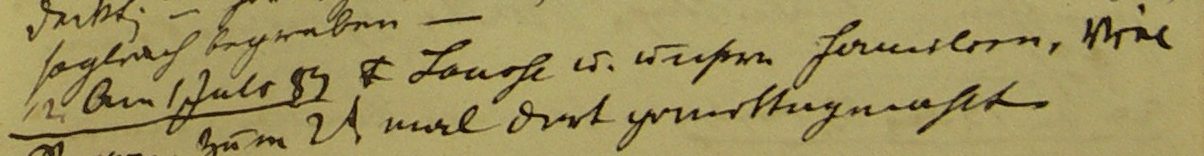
12) Am 1 Juli 83 mit Louise und unseren Familien, viel
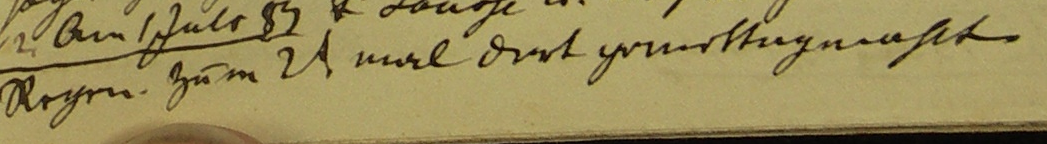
Regen. Zum 2-ten mal dort gemittagemacht.--
